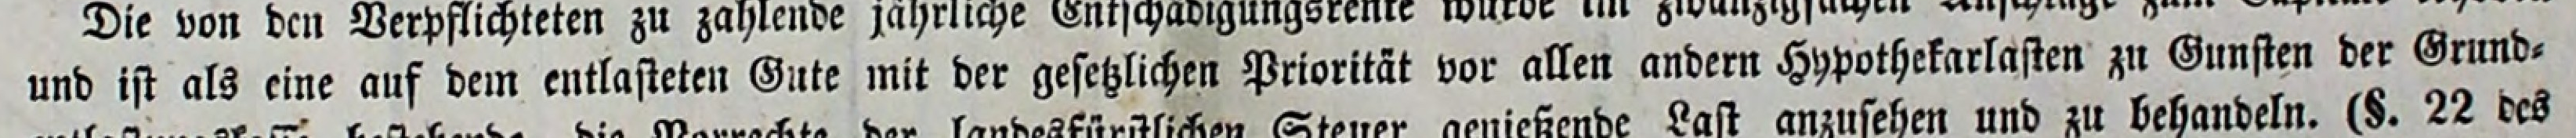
und ist als eine auf dem entlasteten Gute mit der gesetzlichen Priorität vor allen andern Hypothekarlasten zu Gunsten der Grund=
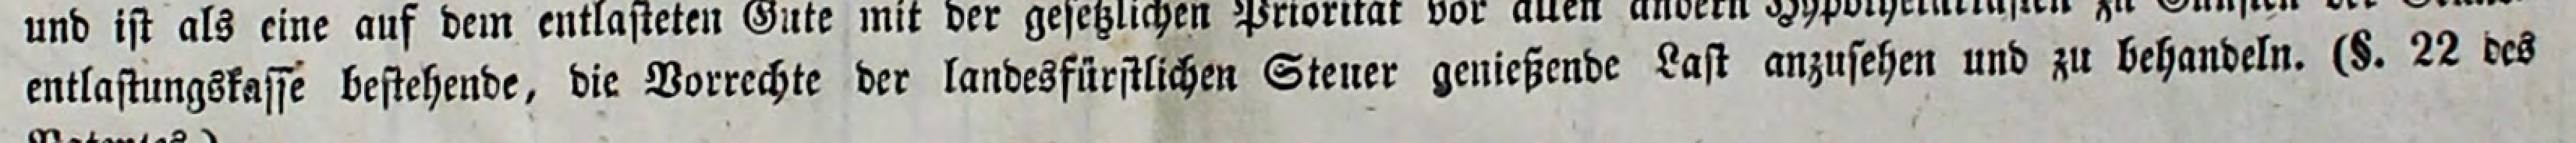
entlastungskasse bestehende, die Vorrechte der landesfürstlichen Steuer genießende Last anzusehen und zu behandeln. (§. 22 des
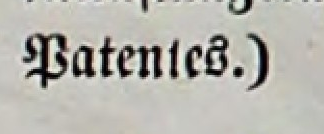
Patentes.)
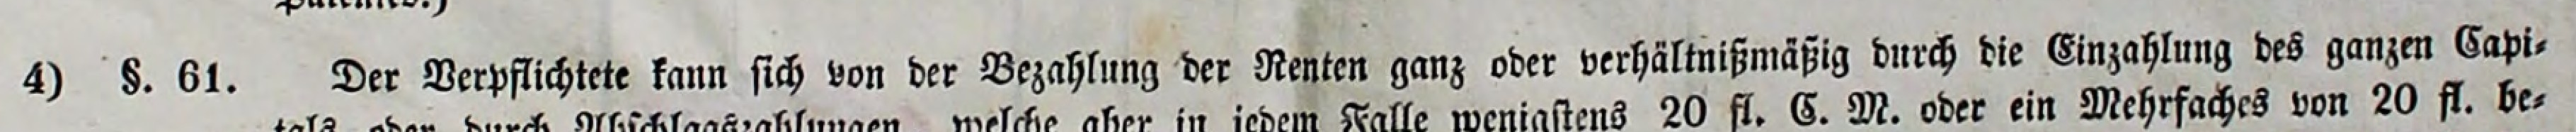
4) §. 61. Der Verpflichtete kann sich von der Bezahlung der Renten ganz oder verhältnißmäßig durch die Einzahlung des ganzen Capi=
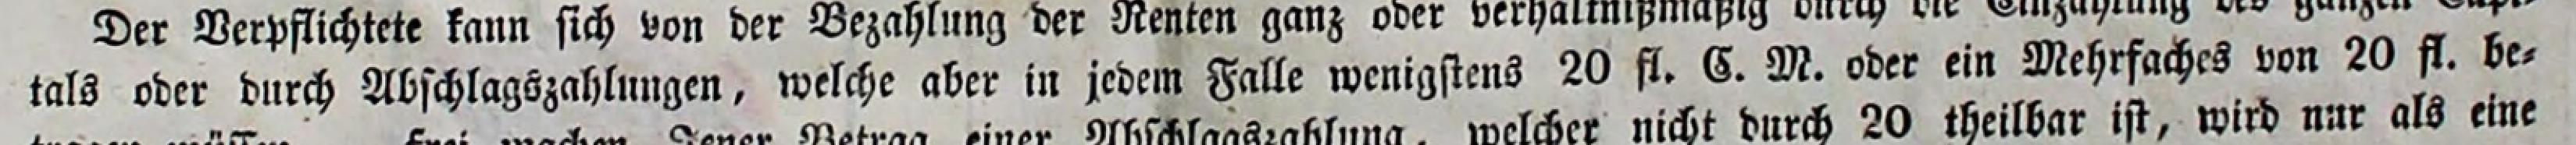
tals oder durch Abschlagszahlungen, welche aber in jedem Falle wenigstens 20 fl. C. M. oder ein Mehrfaches von 20 fl. be=
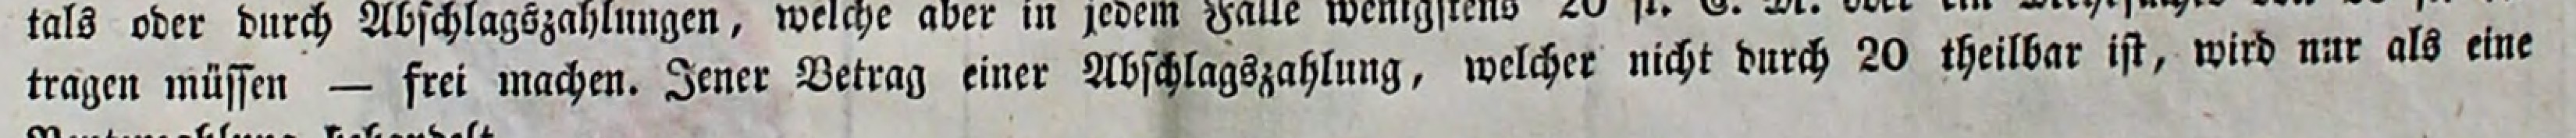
tragen müssen — frei machen. Jener Betrag einer Abschlagszahlung, welcher nicht 20 theilbar ist, wird nur als eine
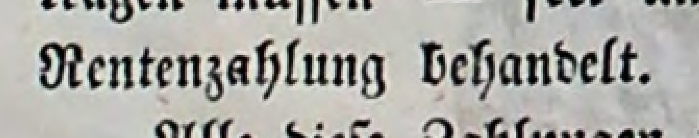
Rentenzahlung behandelt.
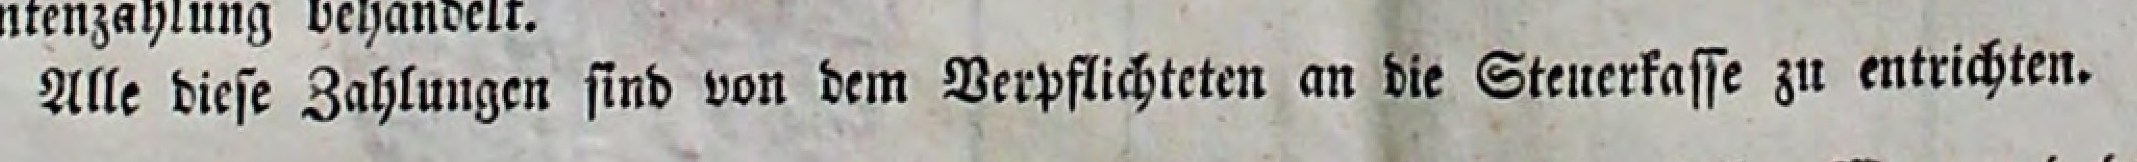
Alle diese Zahlungen sind von dem Verpflichteten an die Steuerkasse zu entrichten.
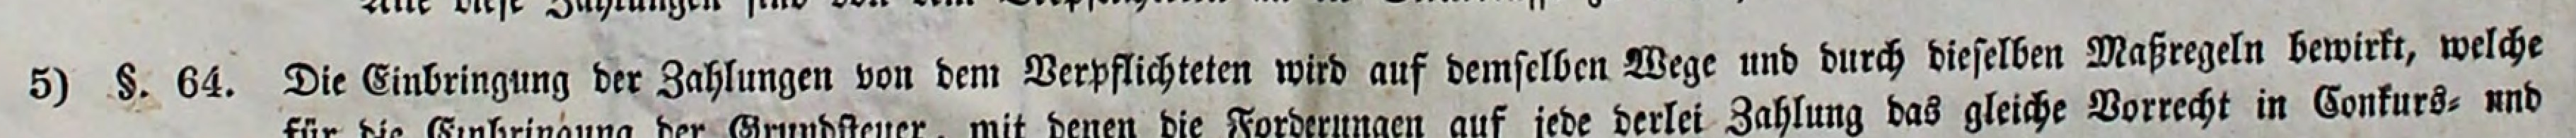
5) §. 64. Die Einbringung der Zahlungen von dem Verpflichteten wird auf demselben Wege und durch dieselben Maßregeln bewrikt, welche
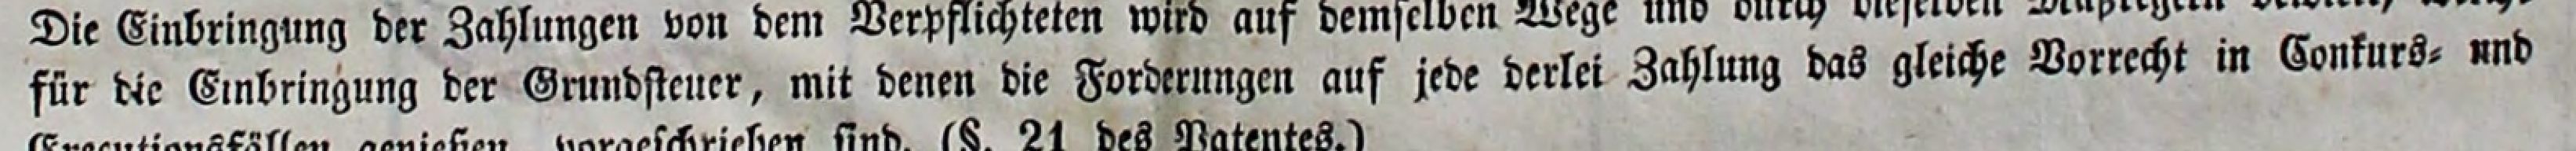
für die Einbringung der Grundsteuer, mit denen die Forderungen auf jede derlei Zahlung das gleiche Vorrecht in Conkurs= und
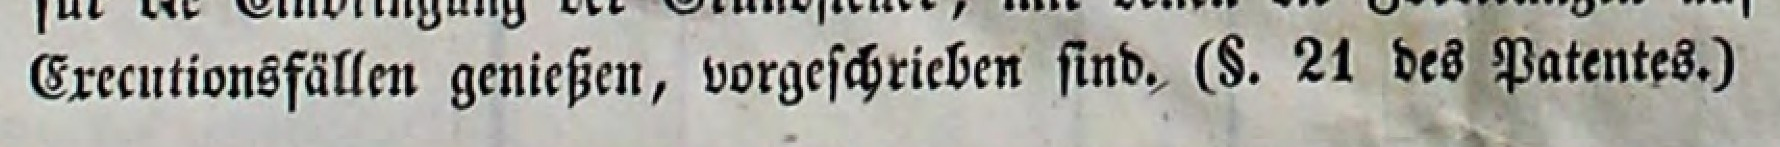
Executionsfällen genießen, vorgeschrieben sind. (§. 21 des Patentes.)
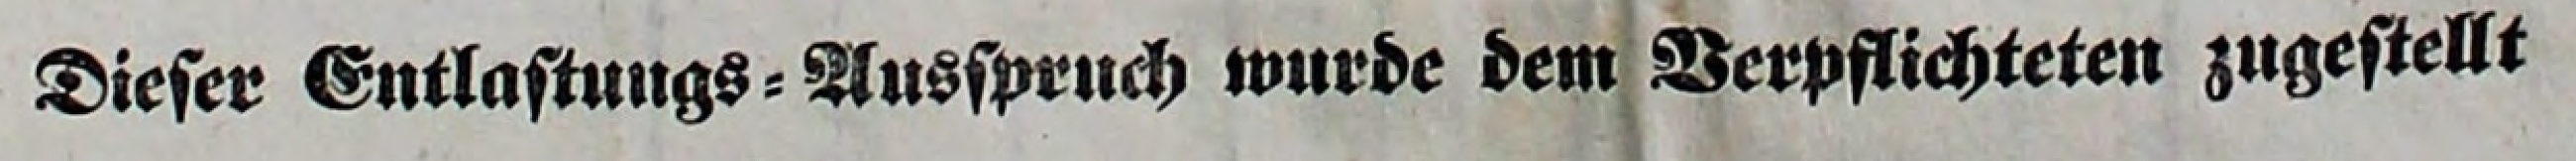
Dieser Entlastungs = Ausspruch wurde dem Verpflichteten zugestellt
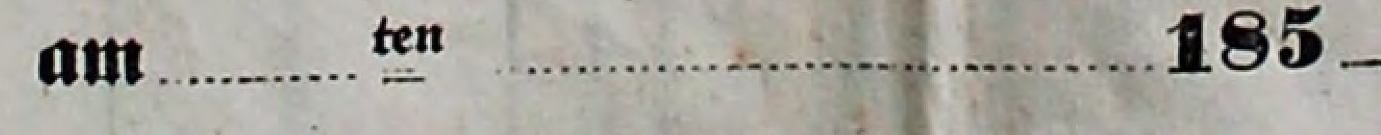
am ....... ten ..........185 ..........—
